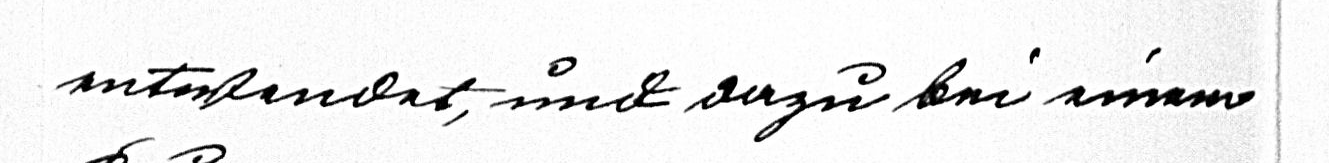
entwendet, und dazu bei einem
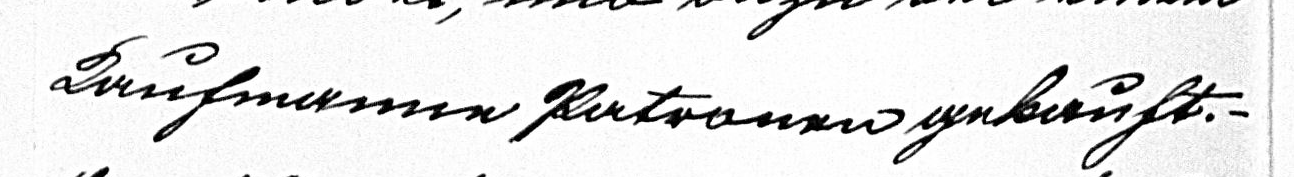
Kaufmanne Patronen gekauft. -
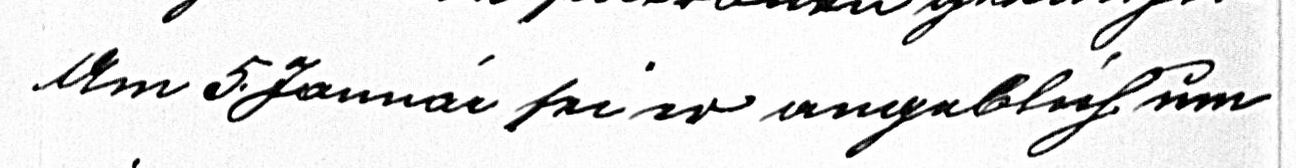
Am 5. Január sei er angeblich um
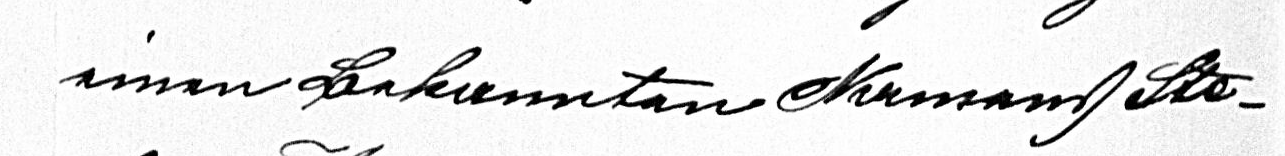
einen Bekannten Namens Ste¬
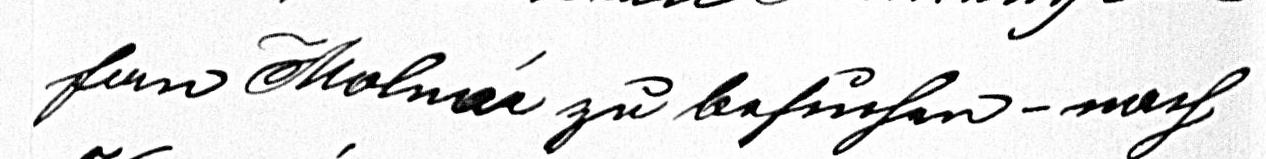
fan Molnác zu besuchen - nach
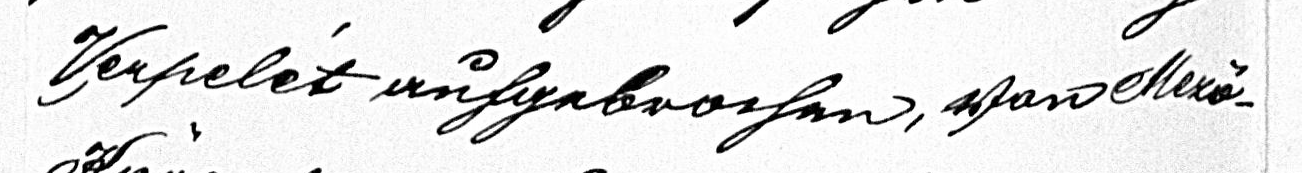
Verpelét aufgebrochen, von Mezö-
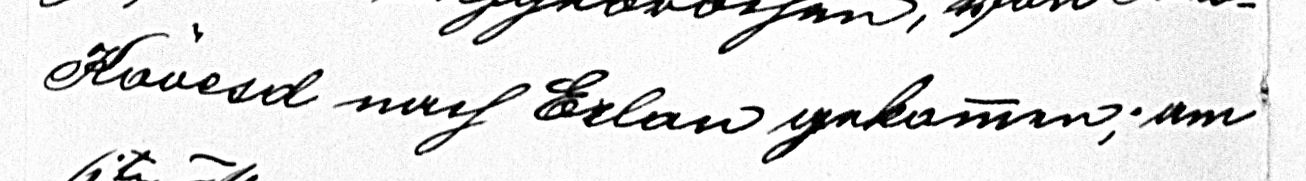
Kövesd nach Erlan gekommen, am
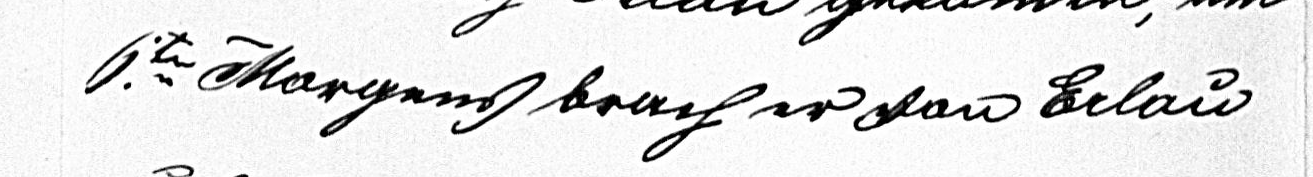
6ten Morgens brach er von Erlau
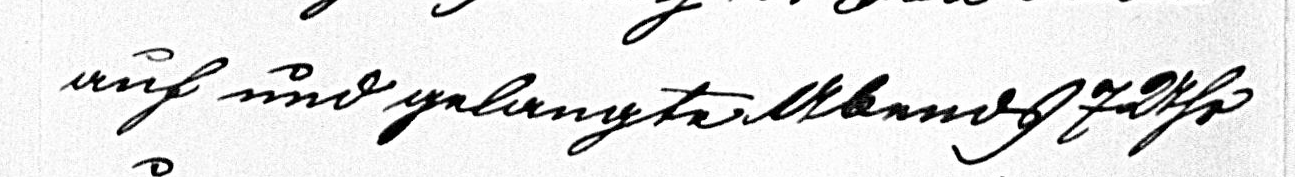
auf und gelangte Abends 7 Uhr
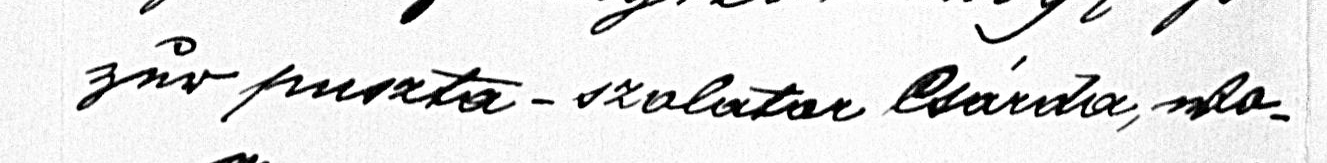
zur puszta - szolator Csárdra, wo¬
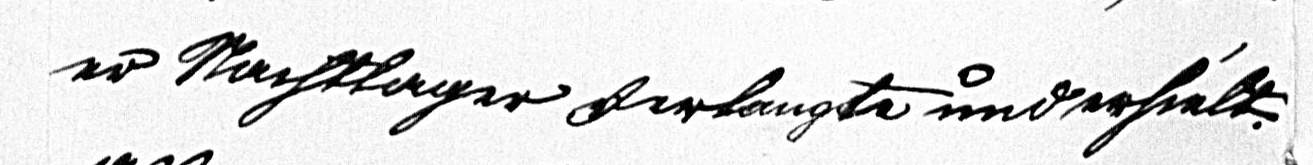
er Nachtlager verlangte und erhielt.
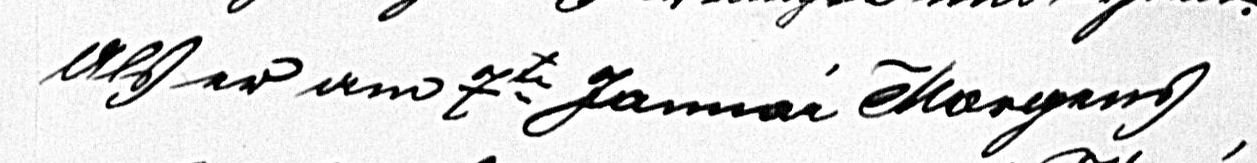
Als er am 7ten Január Morgens
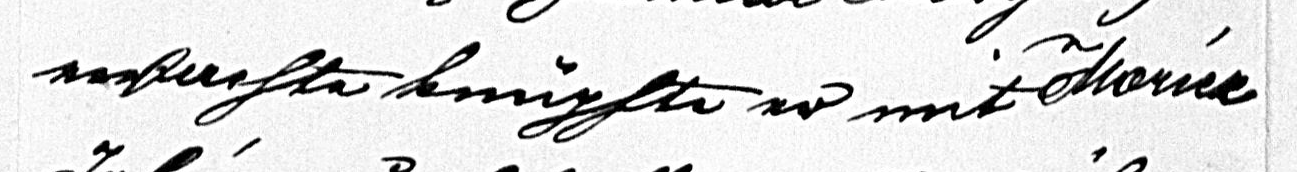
erwachte knüpfte er mit Morcéz
